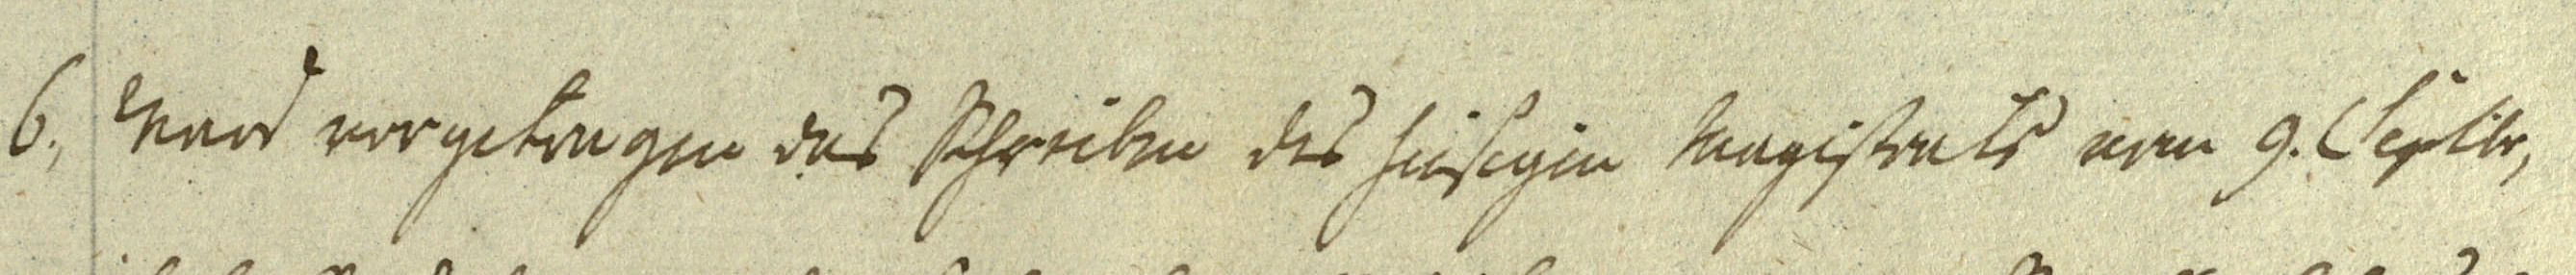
6, Ward vorgetragen das Schreiben des hiesigen Magistrats vom 9. Septbr,
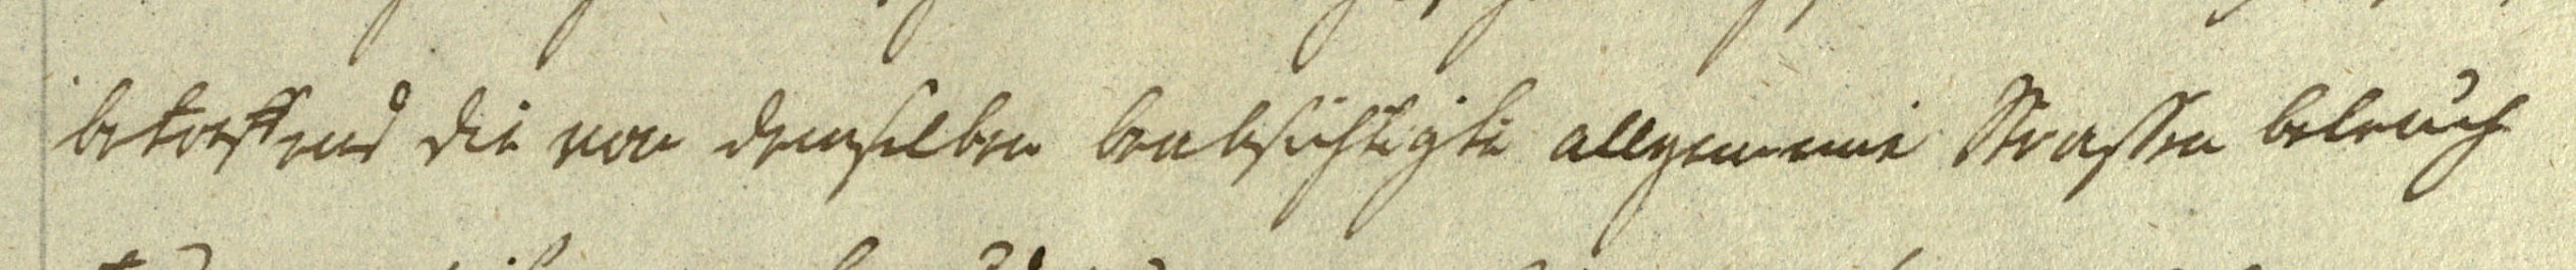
betreffend die von demselben beabsichtigte allgemeine Strassen beleuch¬
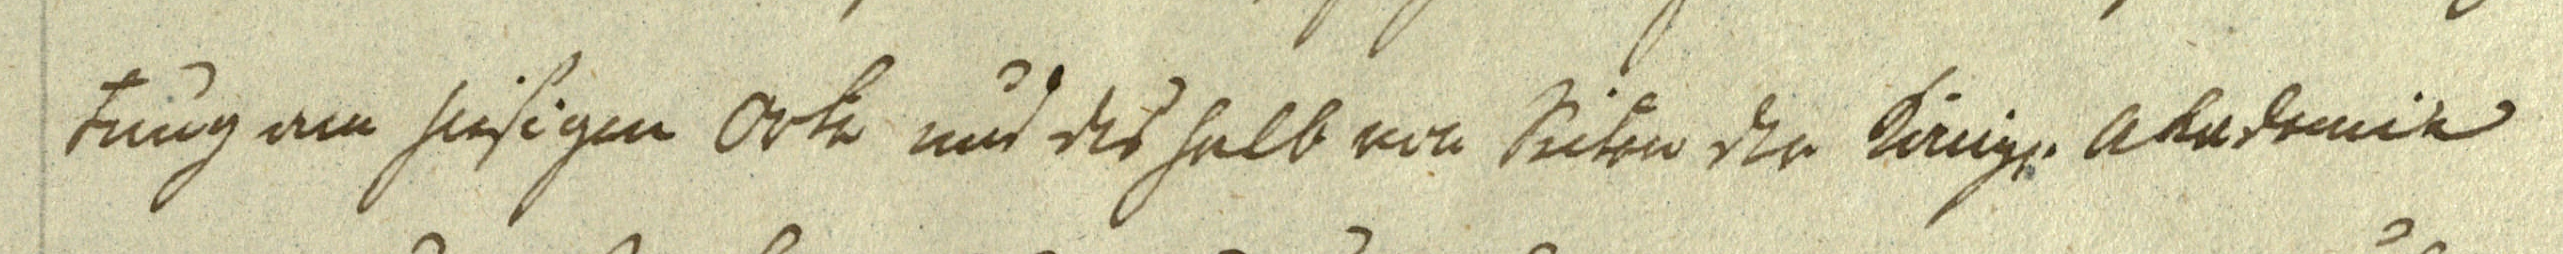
tung am hiesigen Orte und des halb von Seiten der König Akademie
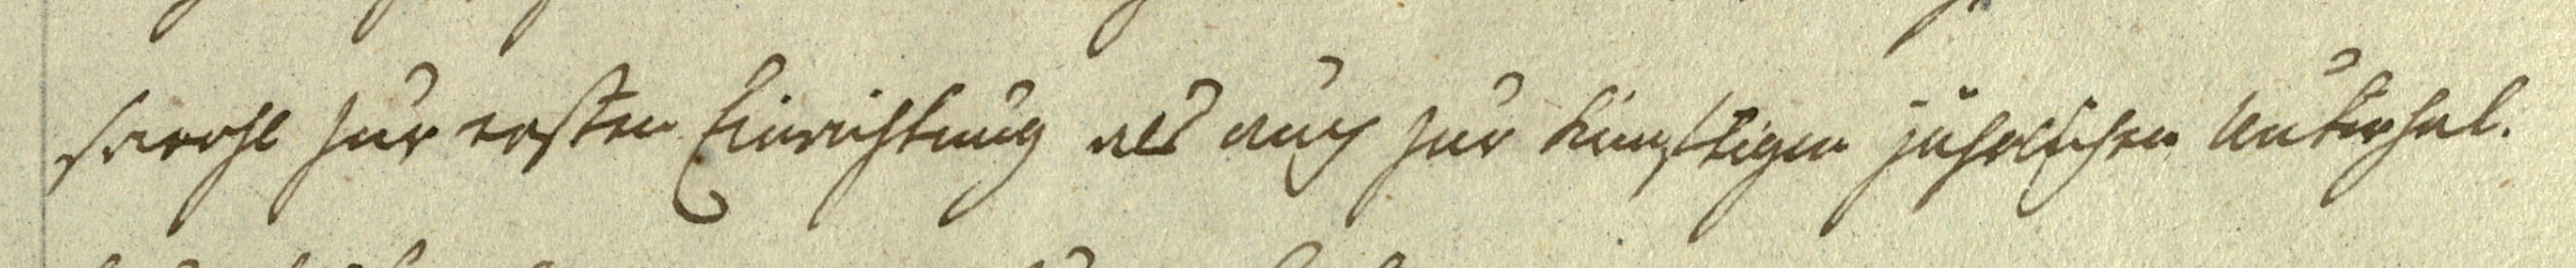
sowohl zur ersten Einrichtung als auch zur künftigen jährlichen Unterhal¬
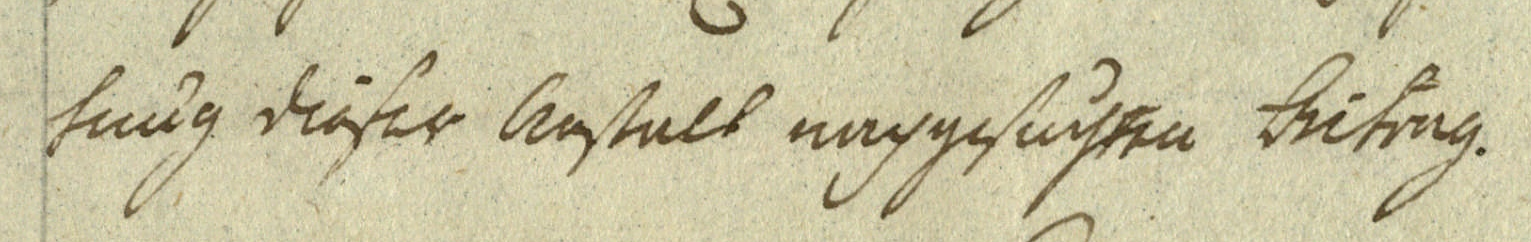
tung dieser Anstalt nachgesuchten Beitrag.
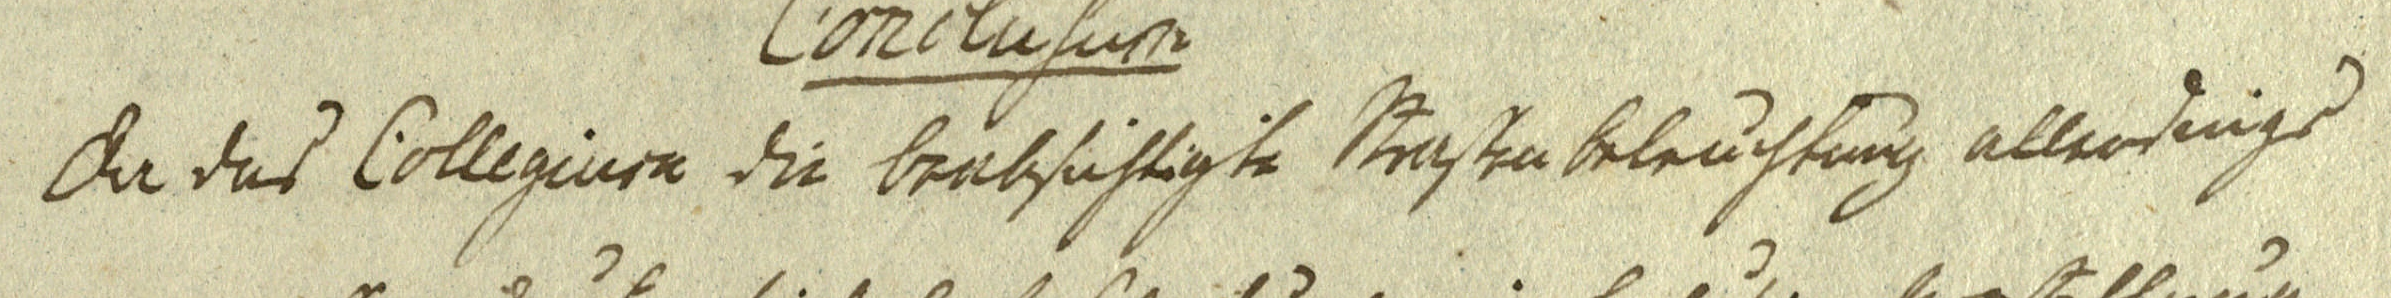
Da das Collegium die beabsichtigte Strassenbeleuchtung allerdings
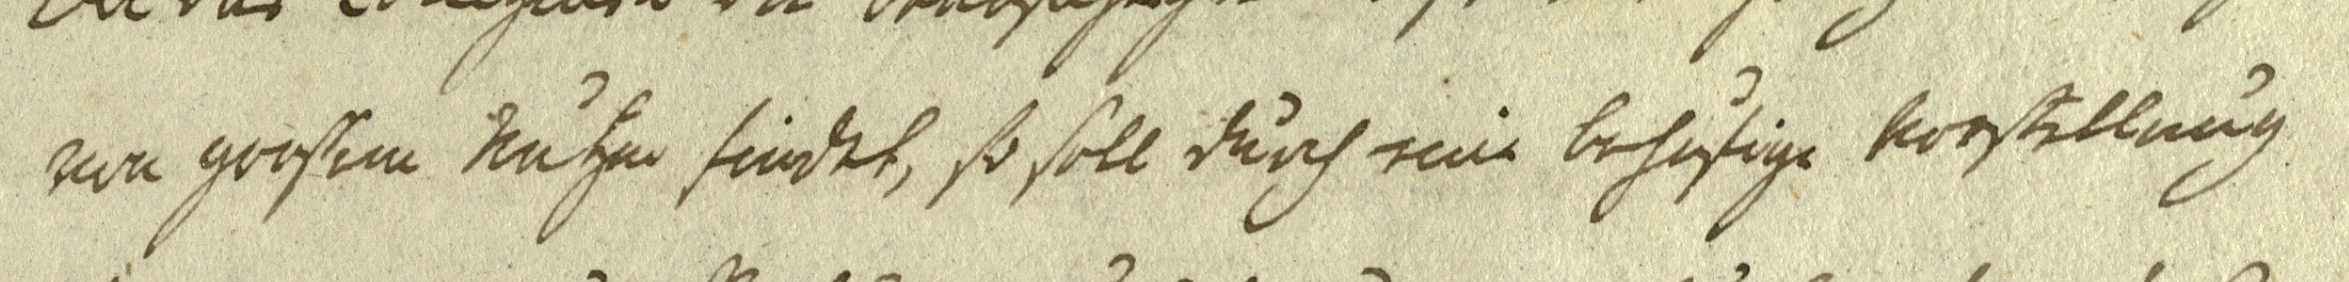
von großem Nutzen findet, so soll durch eine behufige Vorstellung
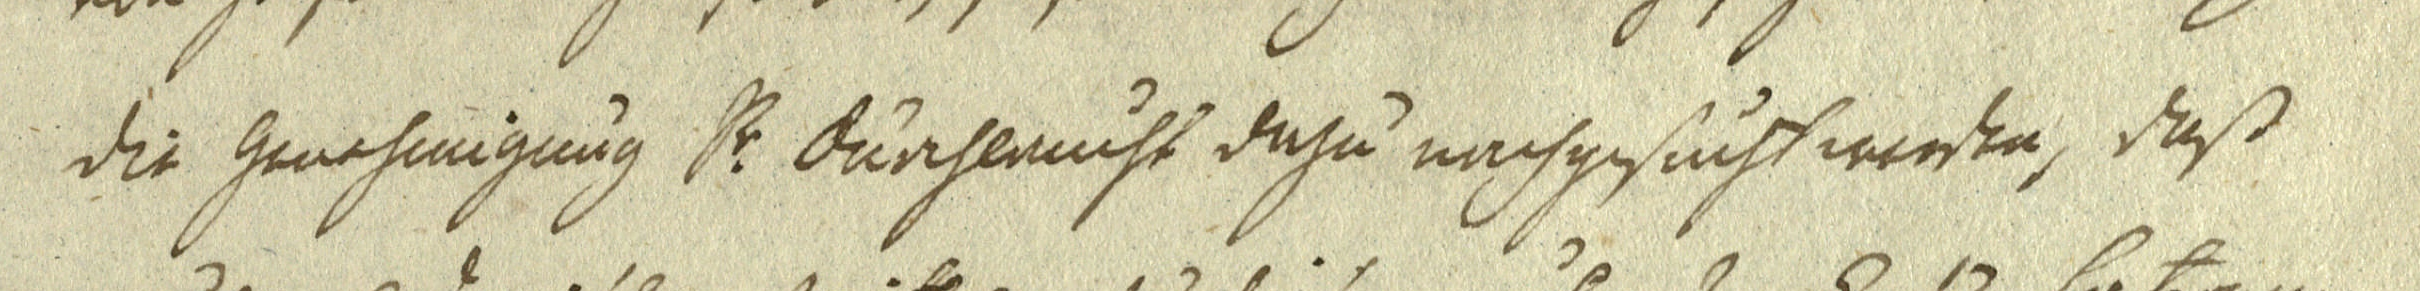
die Genehmigung Sr Durchlaucht dazu nachgesucht werden, daß
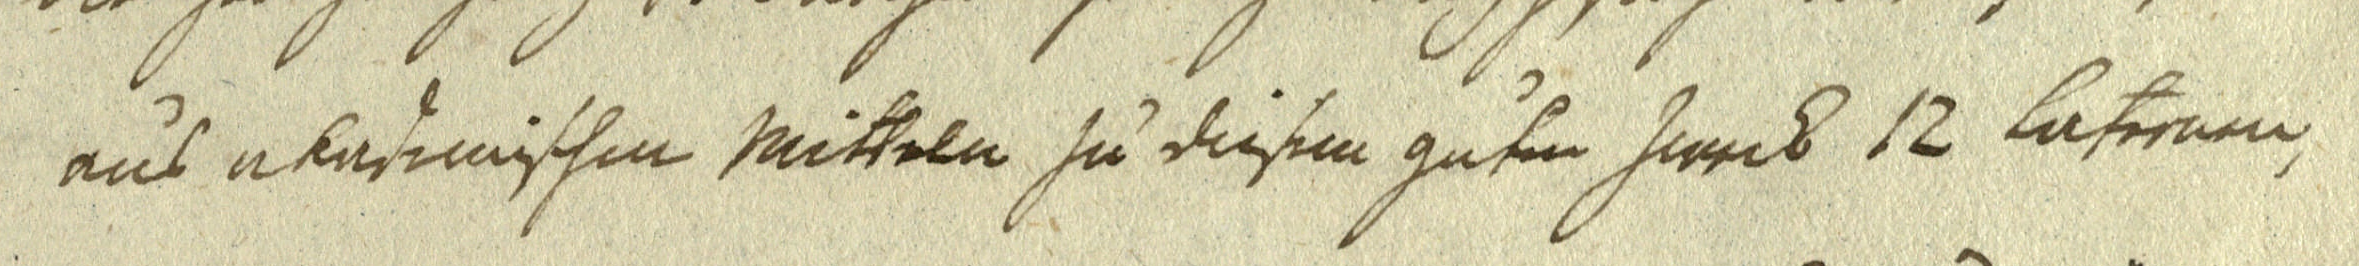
aus akademischen Mitteln zu diesem guten Zweck 12 Laternen,
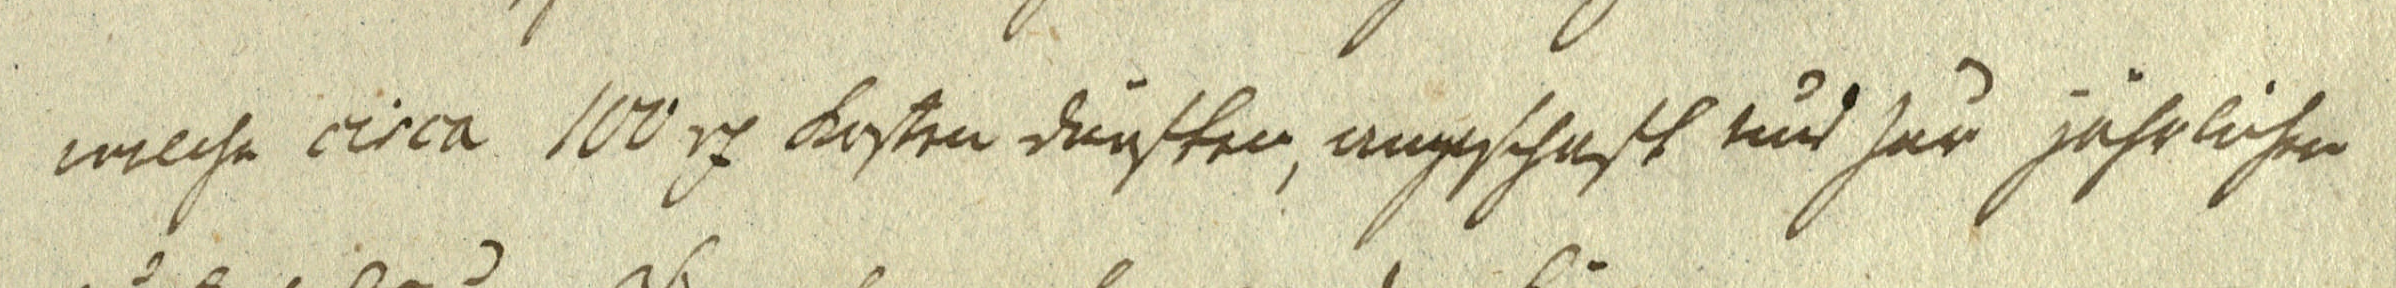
welche circa 100 rt Kosten dürften, angeschaft und zur jährlichen
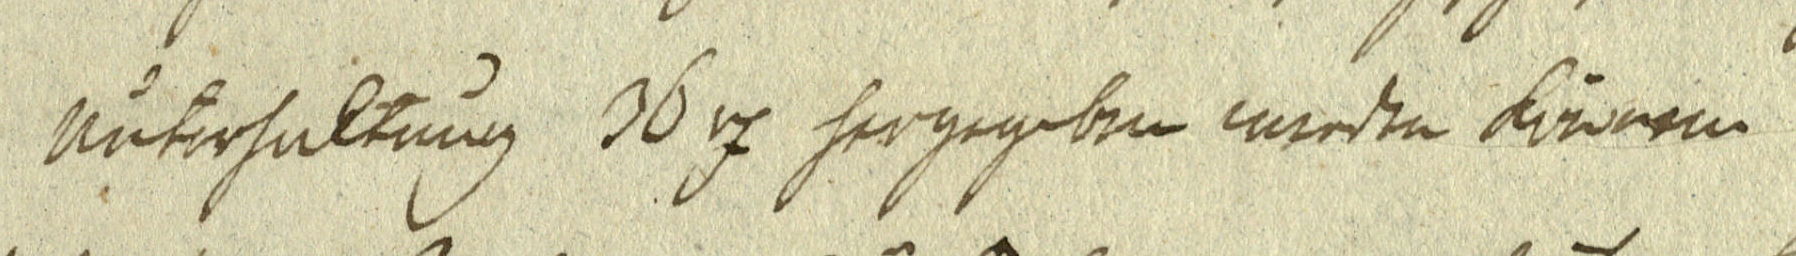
Unterhaltung 30 rt hergegeben werden können.
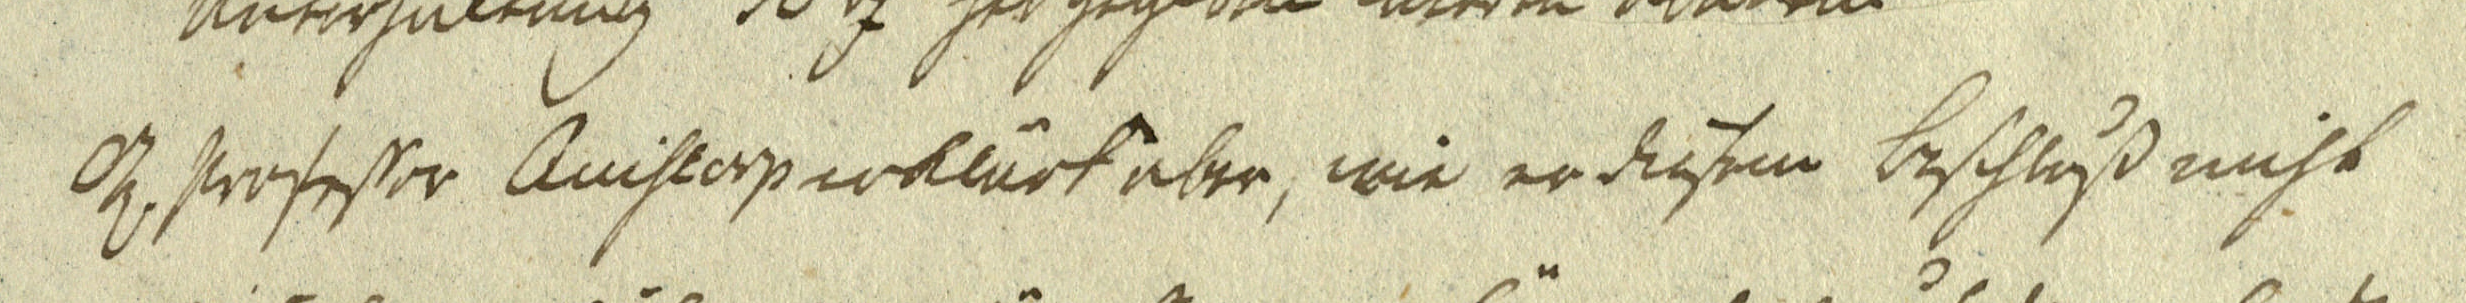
dh. Professor Quistorp erklärt aber, wie er diesem Beschluß nicht
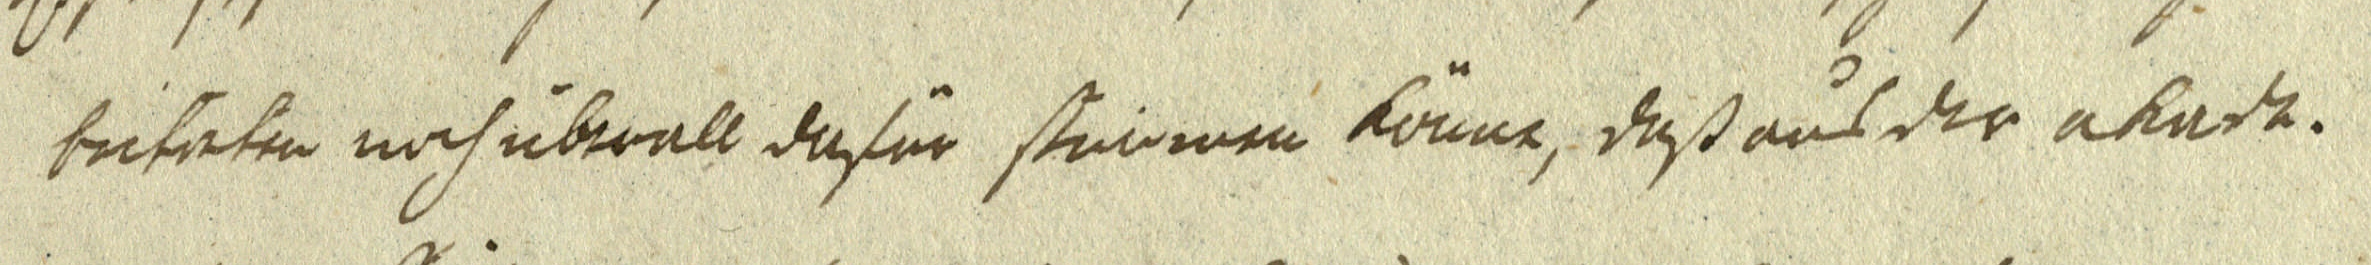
beitreten noch überall dafür stimmen könne, daß aus der akade¬
